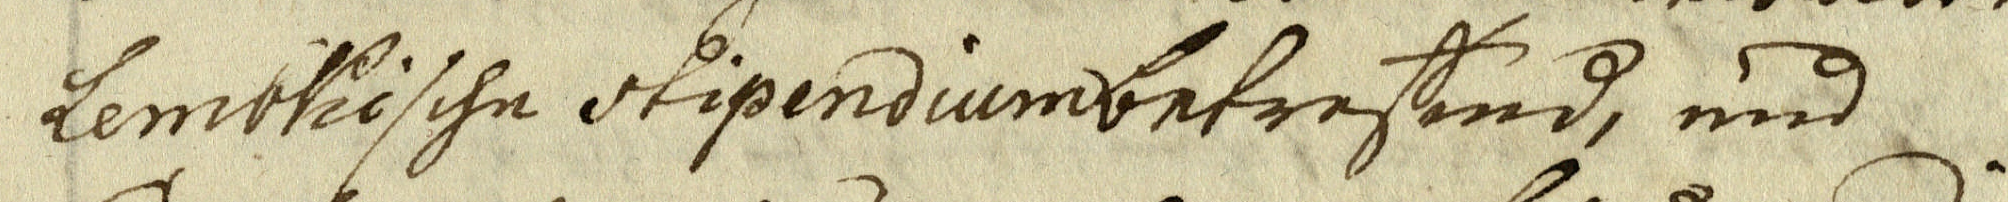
Lembkische stipendium betreffend, und
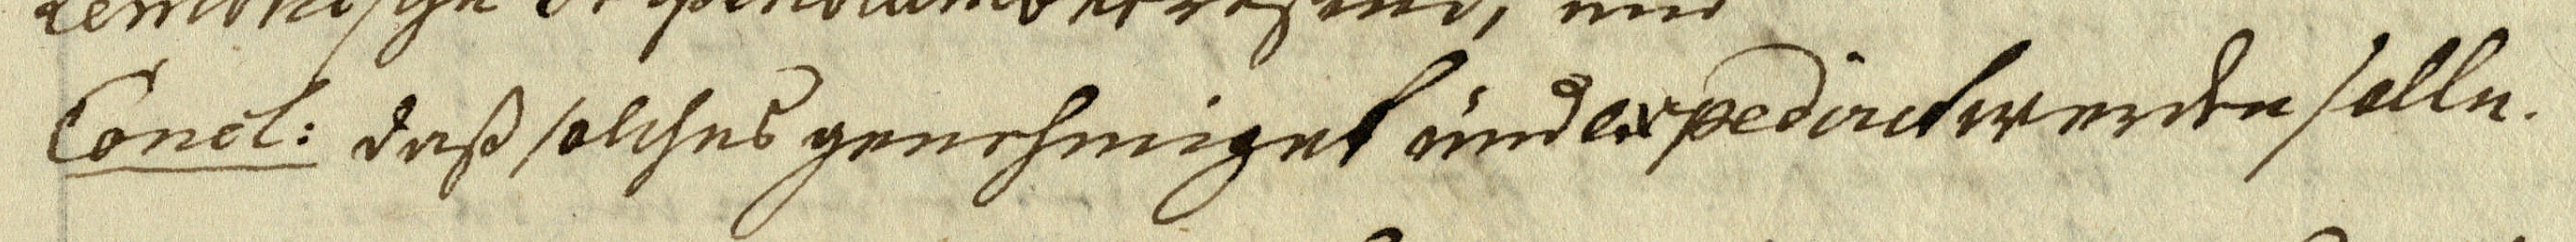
Concl. daß solches genehmiget und expediret werden solle.
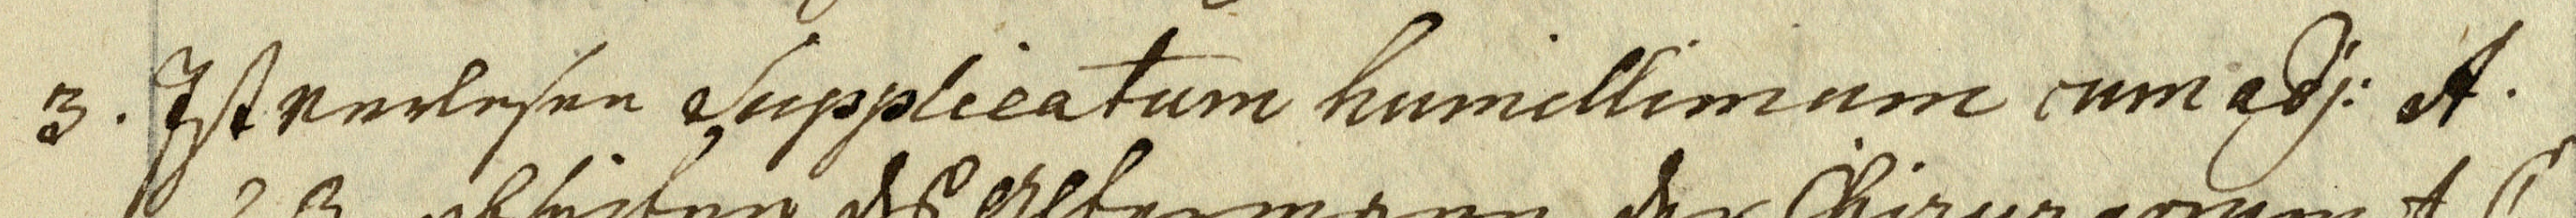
3. Ist verlesen Supplicatum humillimum cum adj. A.
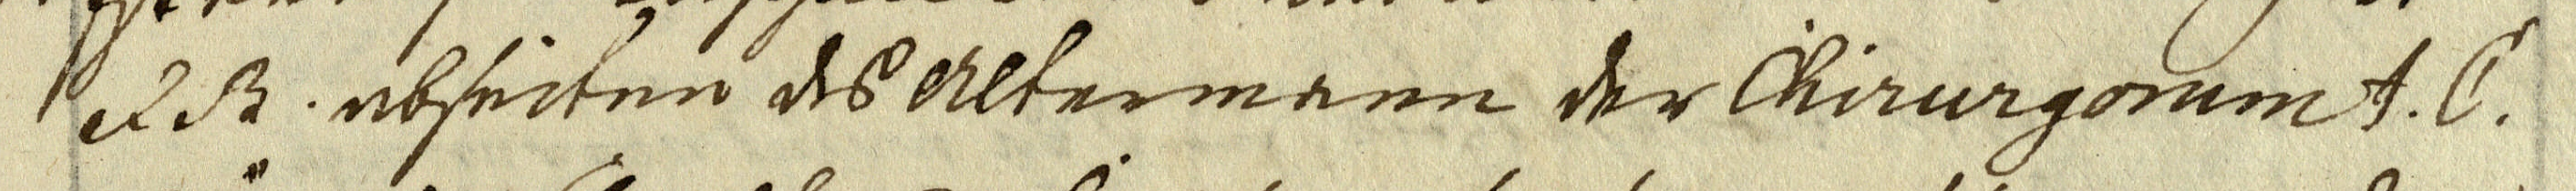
et B. abseiten des Altermann der Chirurgorum J. C.
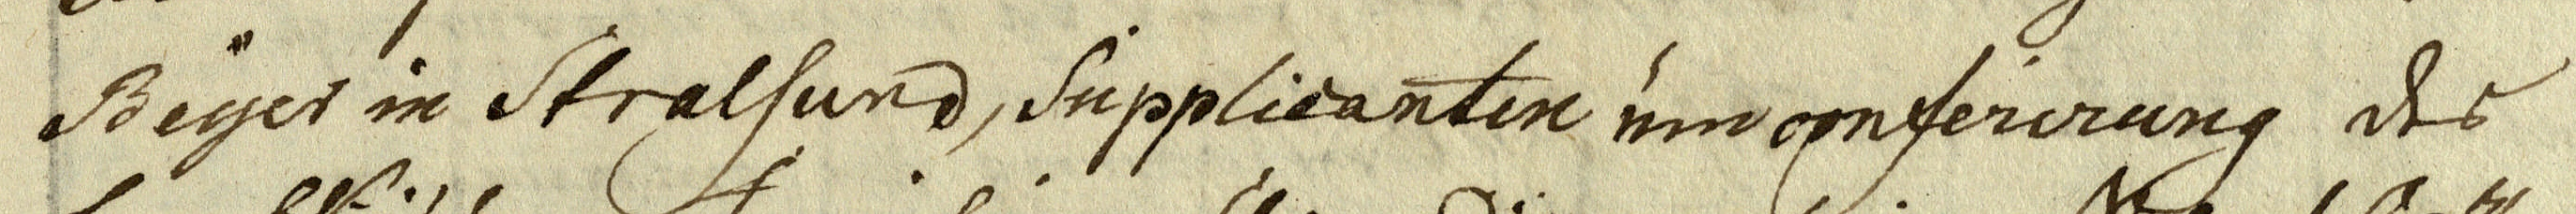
Beÿer in Stralsund, Supplicanten um conferirung des
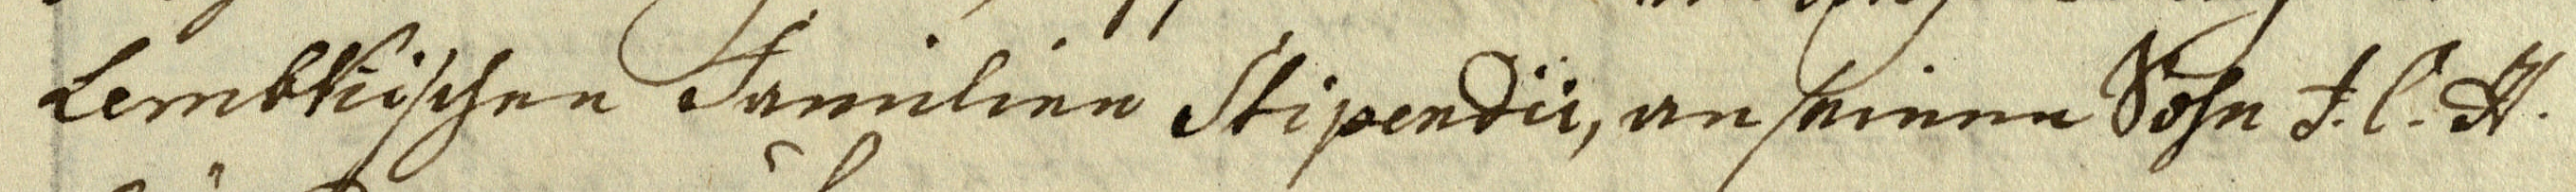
Lembkischen Familien Stipendii, an seinen Sohn F. C. H.
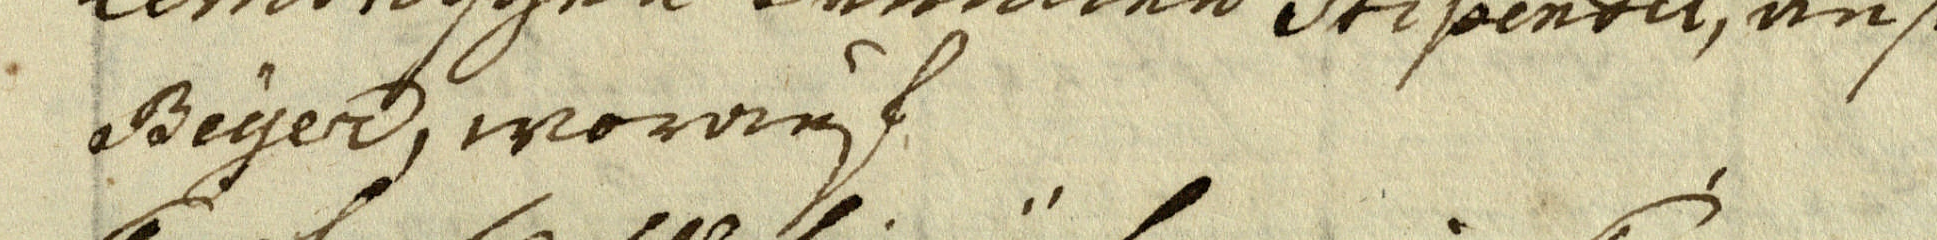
Beÿer, worauf
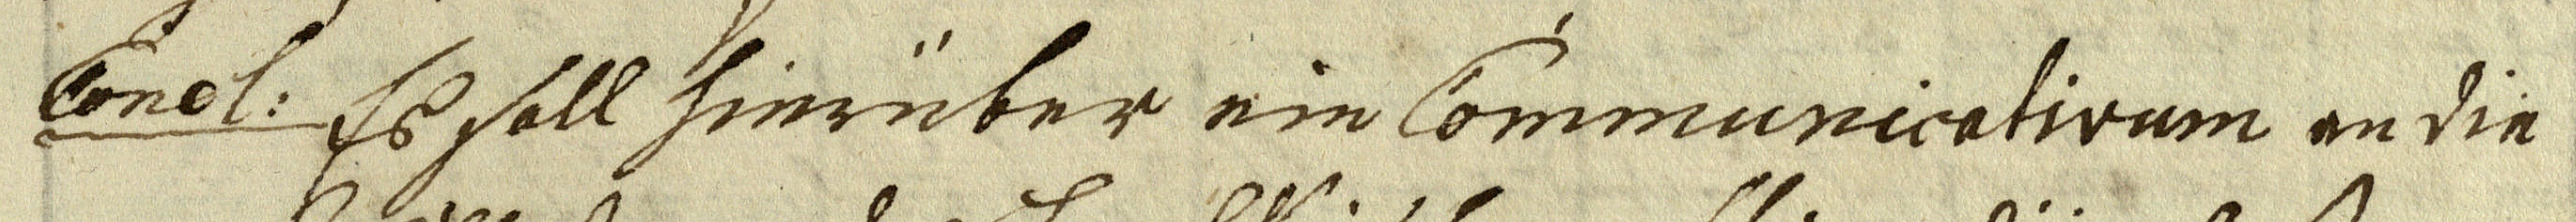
Concl. Es soll hierüber ein Communicativum an die
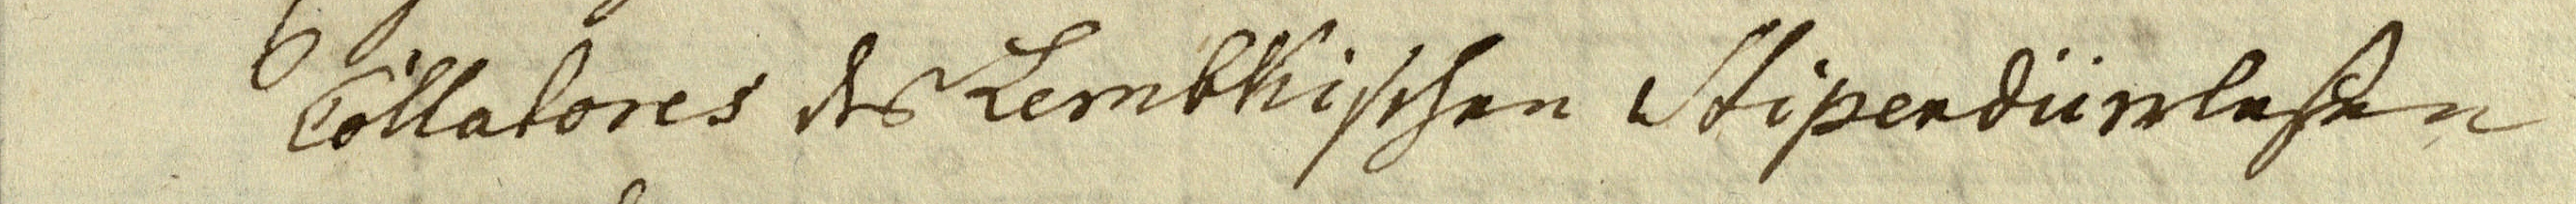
Collatores des Lembkischen Stipendii erlaßen
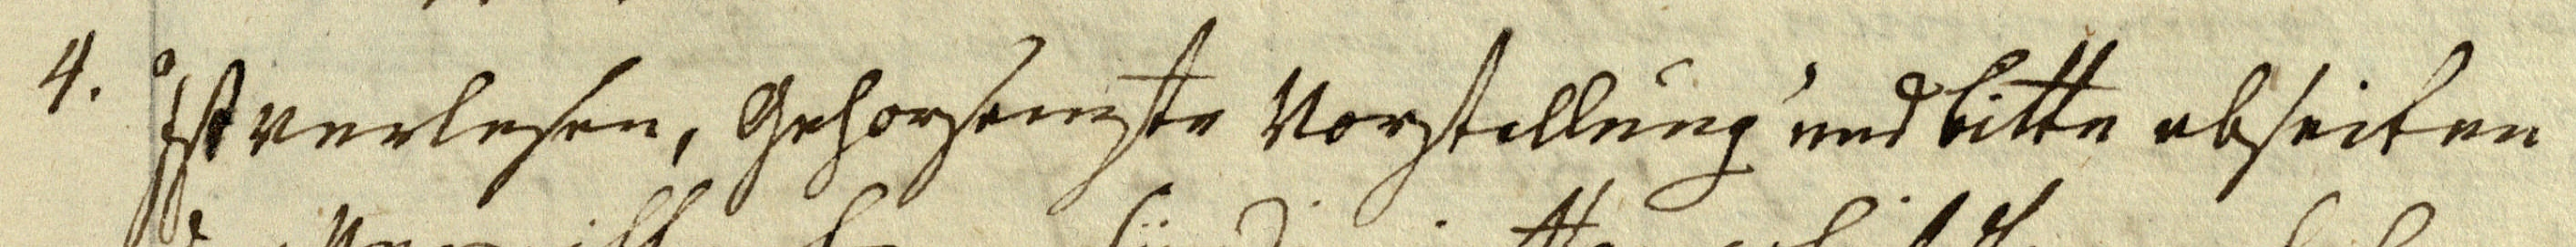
4. Ist verlesen, gehorsamste Vorstellung und Bitte abseiten
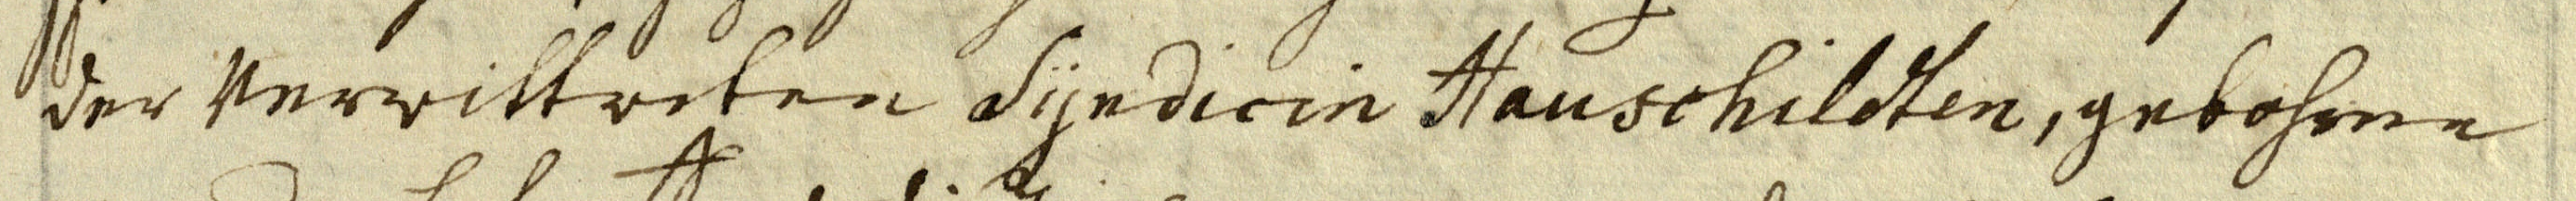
der verwittweten Sÿdicin Hauschildten, gebohrene
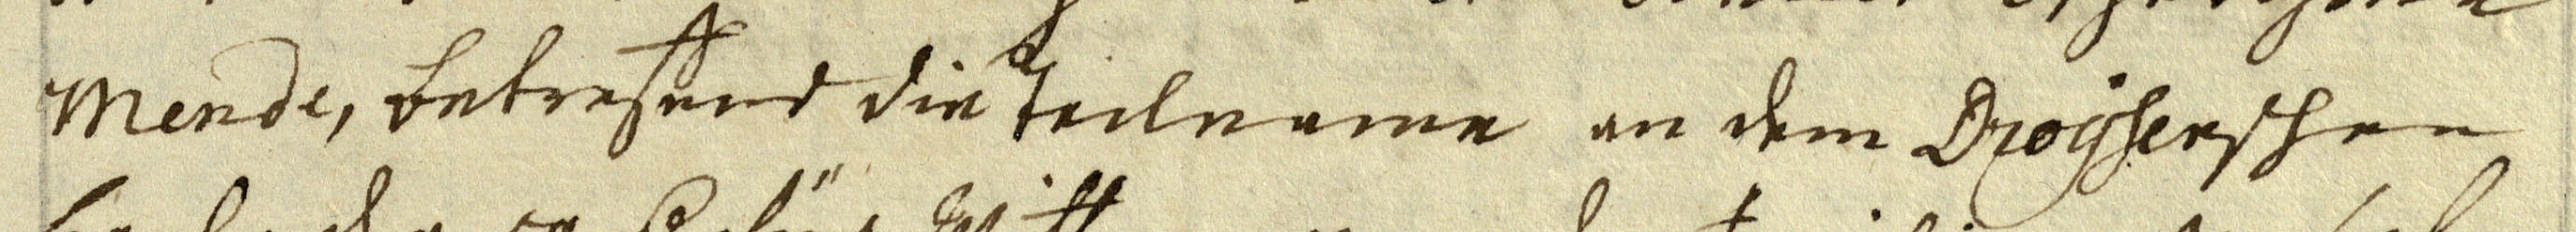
Mende, betreffend die teilname an dem Droÿsenschen
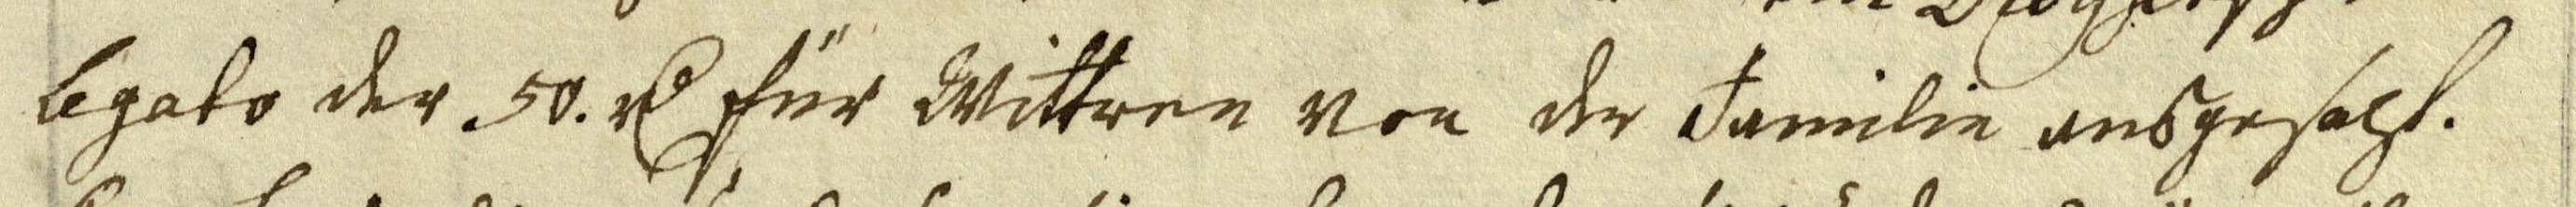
legato der 50 r. für Wittwen von der Familie ausgesezt.
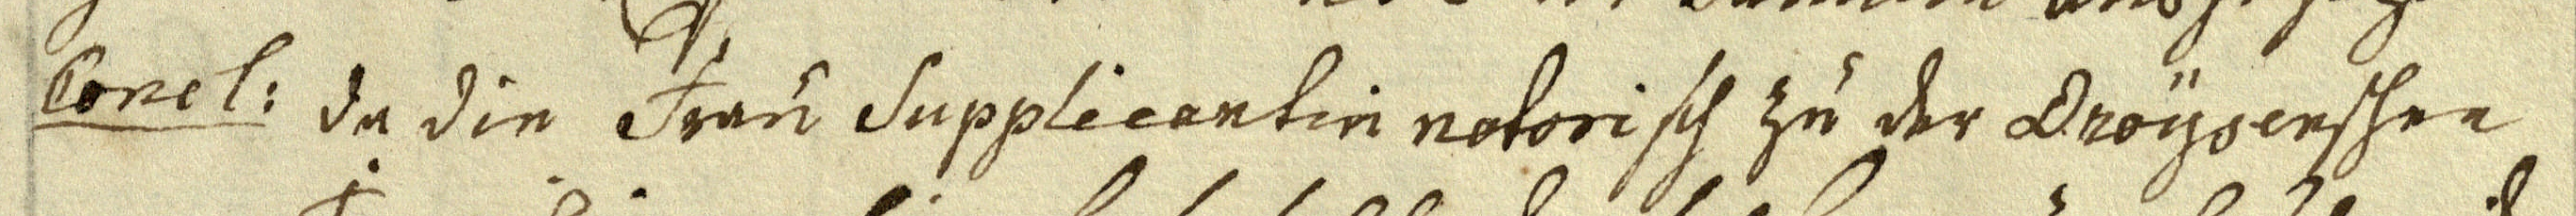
Concl. da die Frau Supplicantin notorisch zu der Droÿsenschen
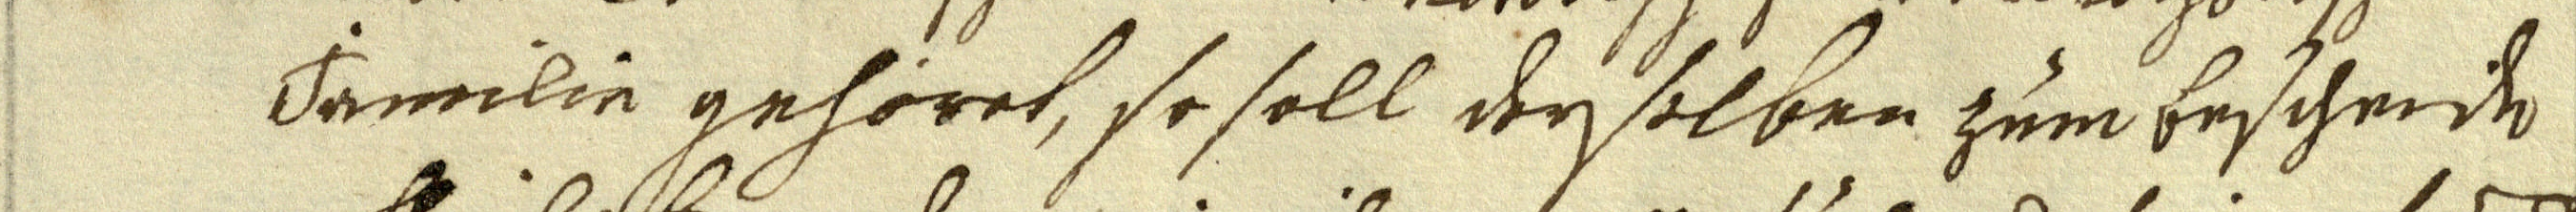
Familie gehöret, so soll derselben zum Bescheide
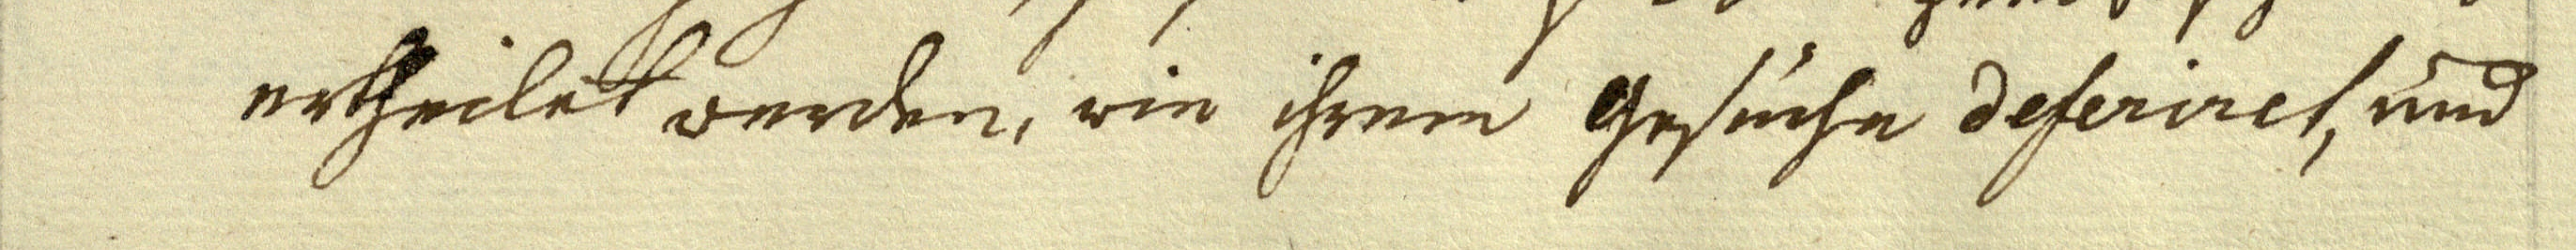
ertheilet werden, wie ihrem Gesuche deferiret, und
